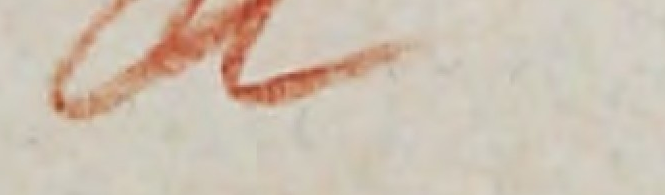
A
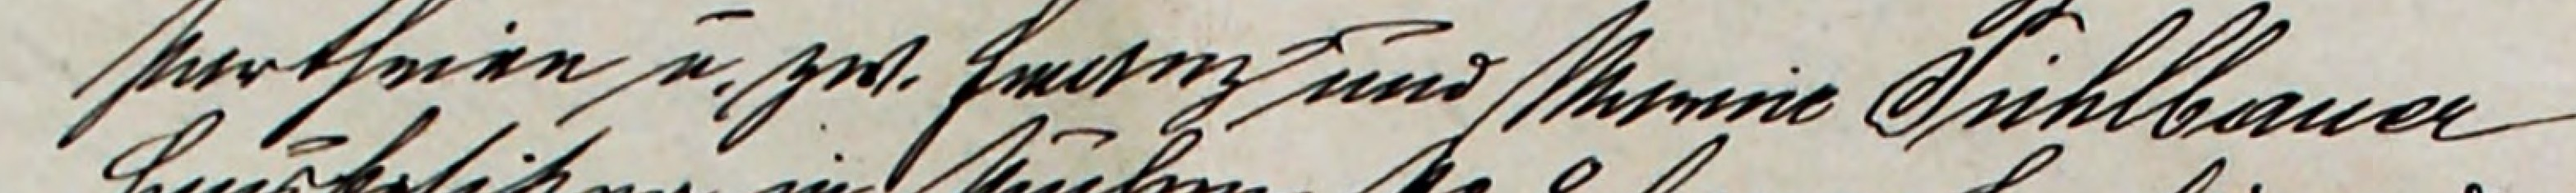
Partheien u. zw. Franz und Maria Pichlbauer
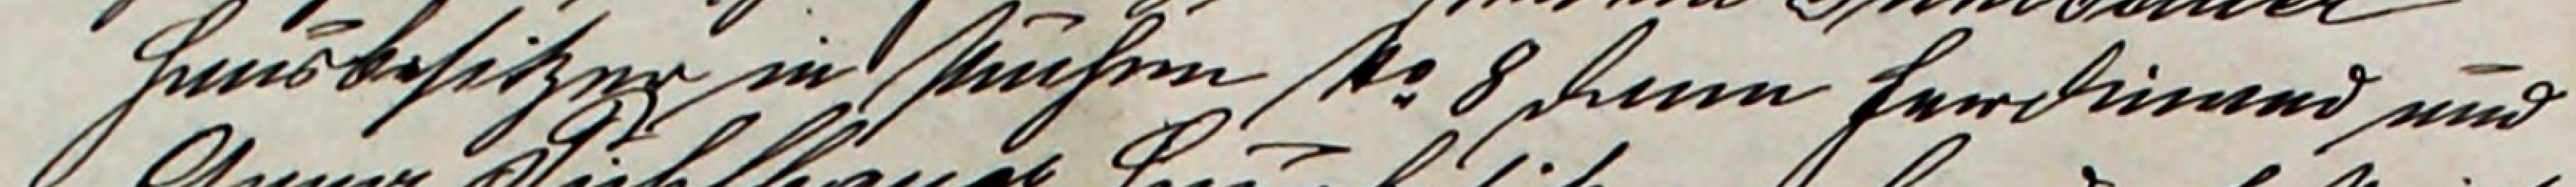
Hausbesitzer in Muhen No 8 dann Ferdinand und
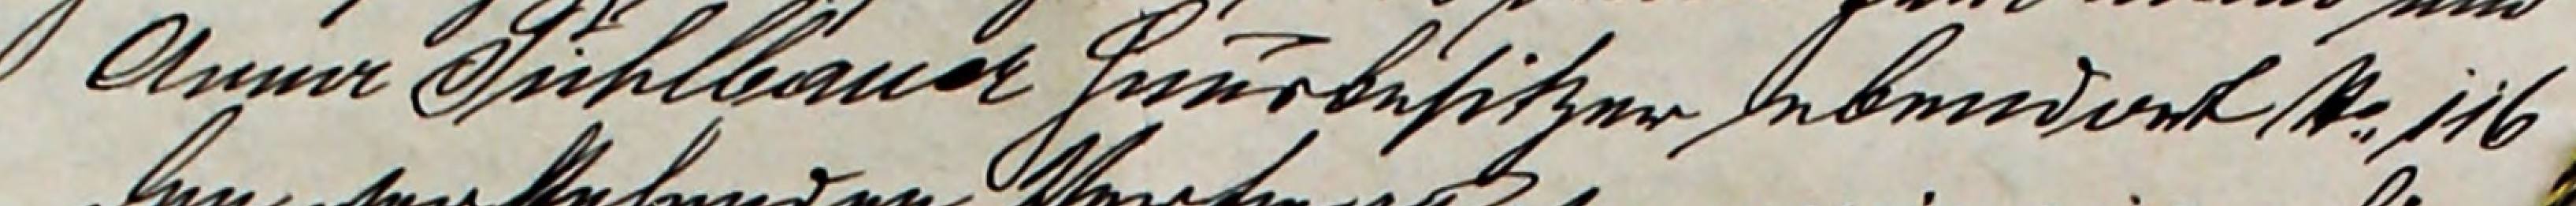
Anna Pichlbauer Hausbesitzer ebendort No 116
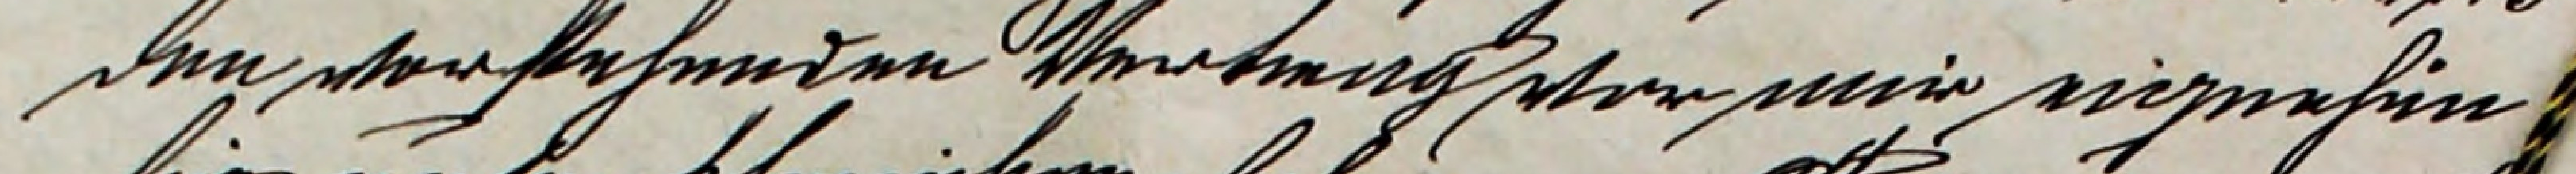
den vorstehenden Vertrag vor mir eigenhün
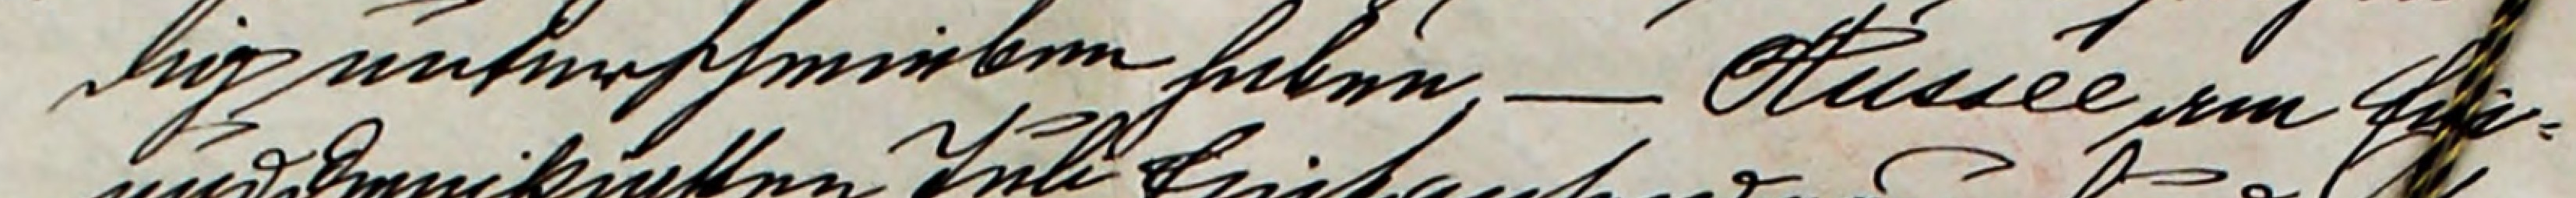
dig unterschrieben haben — Aussee am Ein=
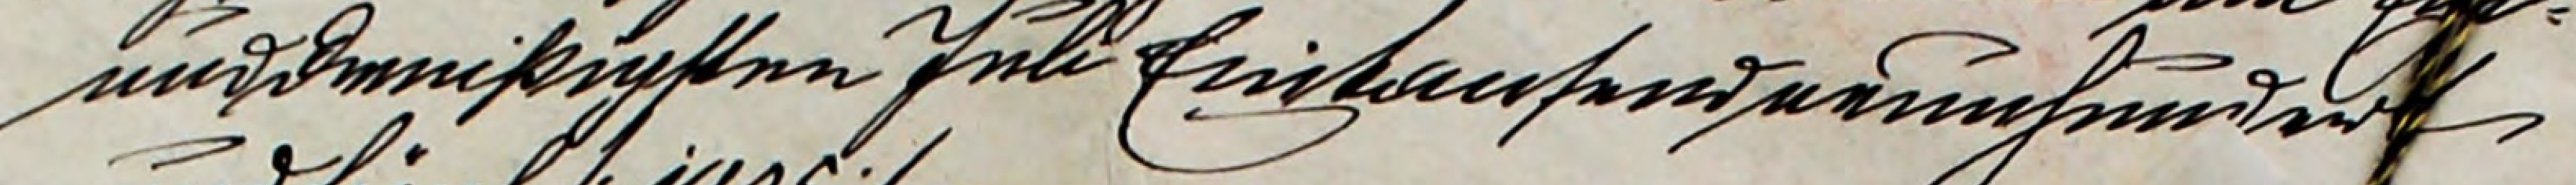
und dreißigsten Juli Eintausendneunhundert
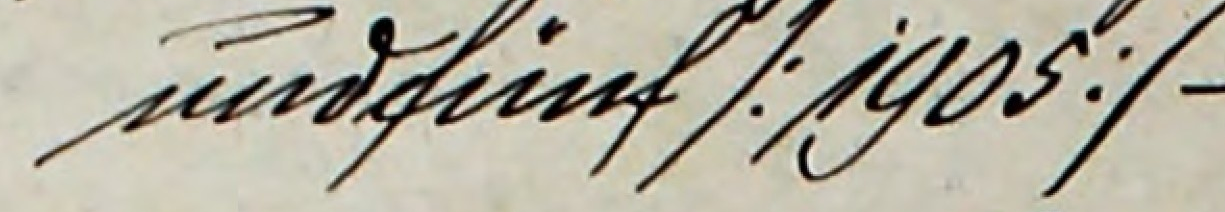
undfünf /:1905:/
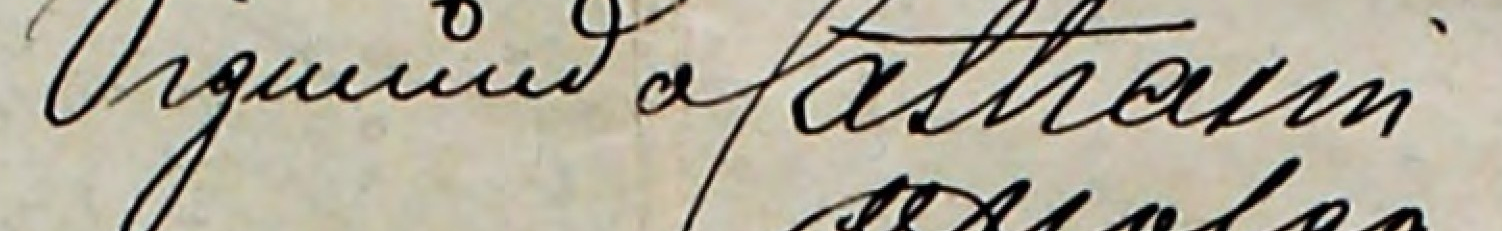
Sigmund Catharin
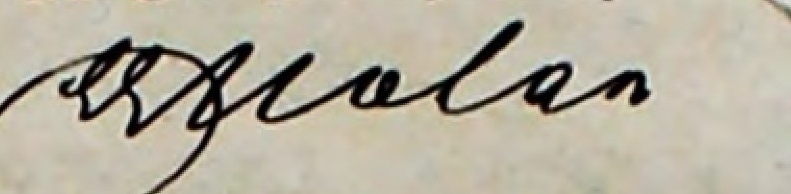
Malan
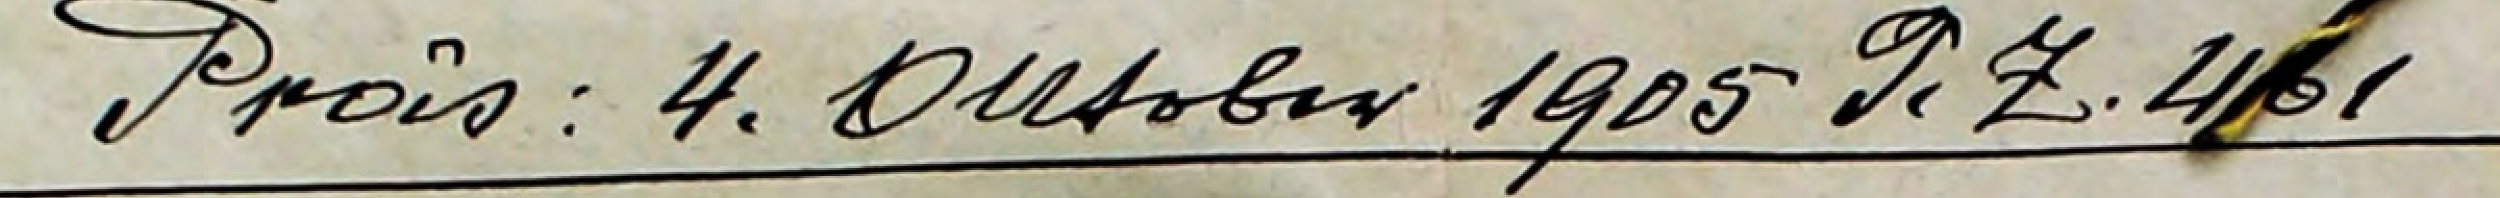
Präs: 4. Oktober 1905 P.Z. 461
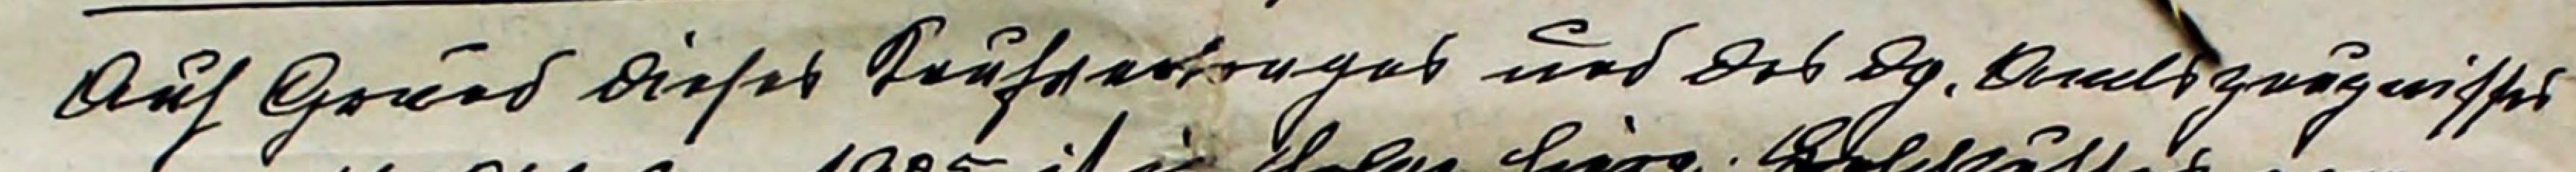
Auf Grund dieses Kaufvertrages und des dg. Amtszeugnisses
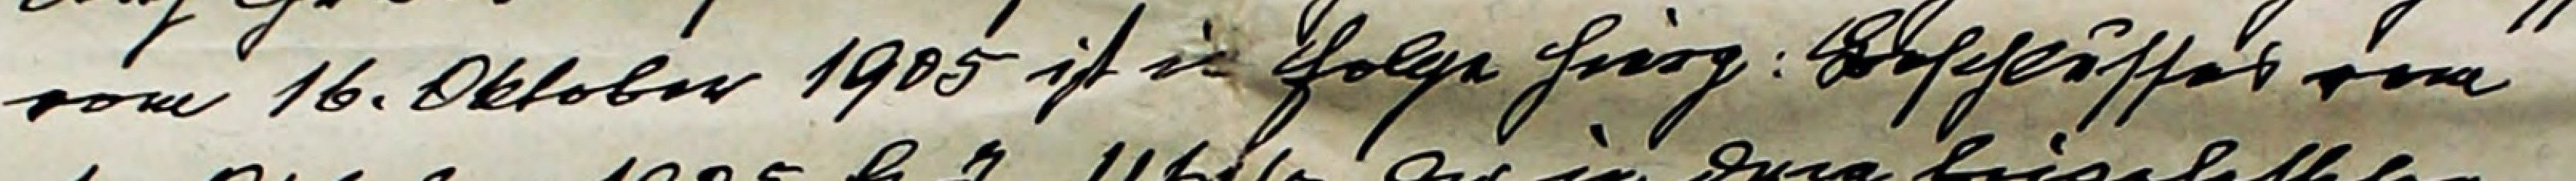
vom 16. Oktober 1905 ist in Folge hierg: Beschlusses vom
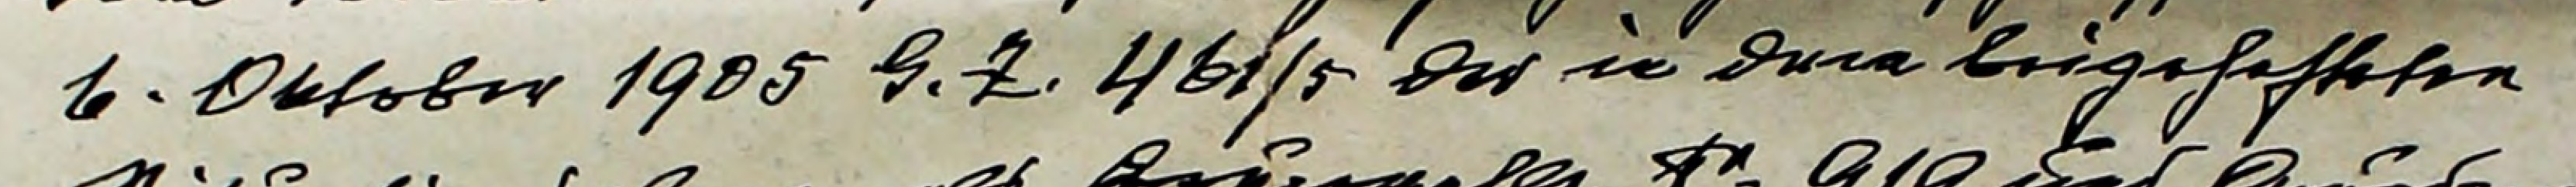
6. Oktober 1905 G.Z. 461/5 der in dem beigehefteten
